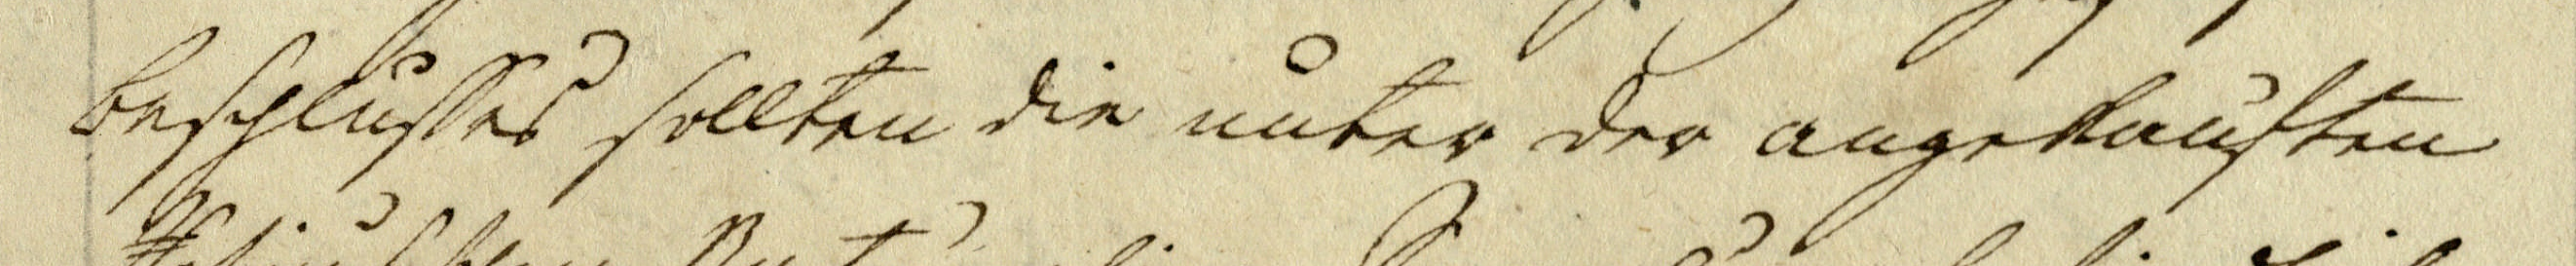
Beschlusses sollten die unter der angekauften
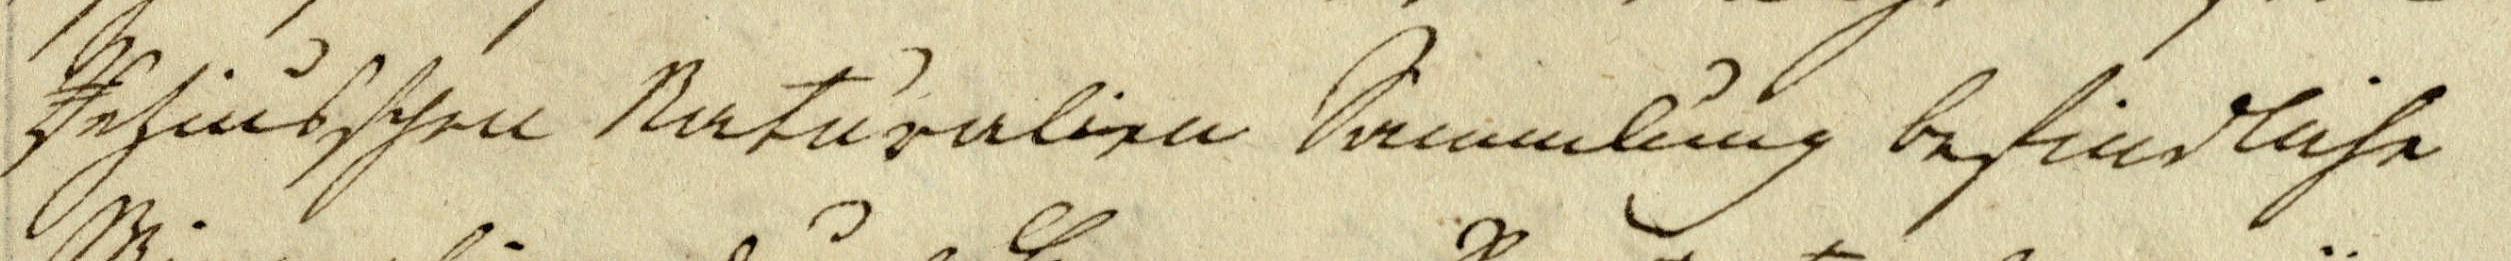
Reziusschen Naturalien Sammlung befindliche
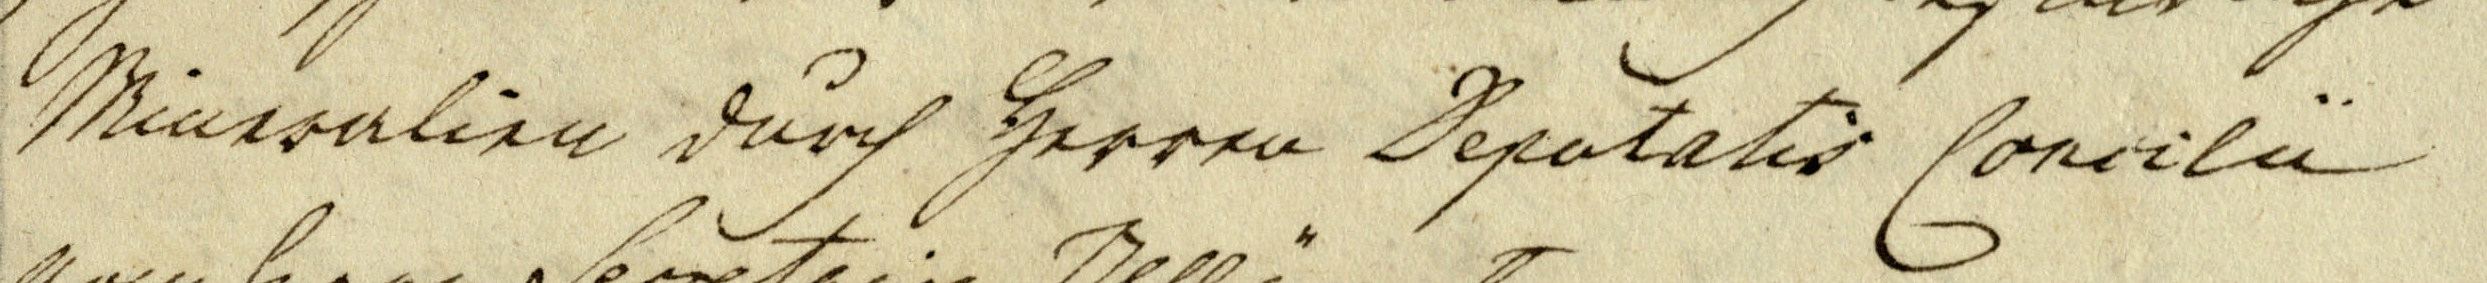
Mineralien durch Herren Deputatis Concilii
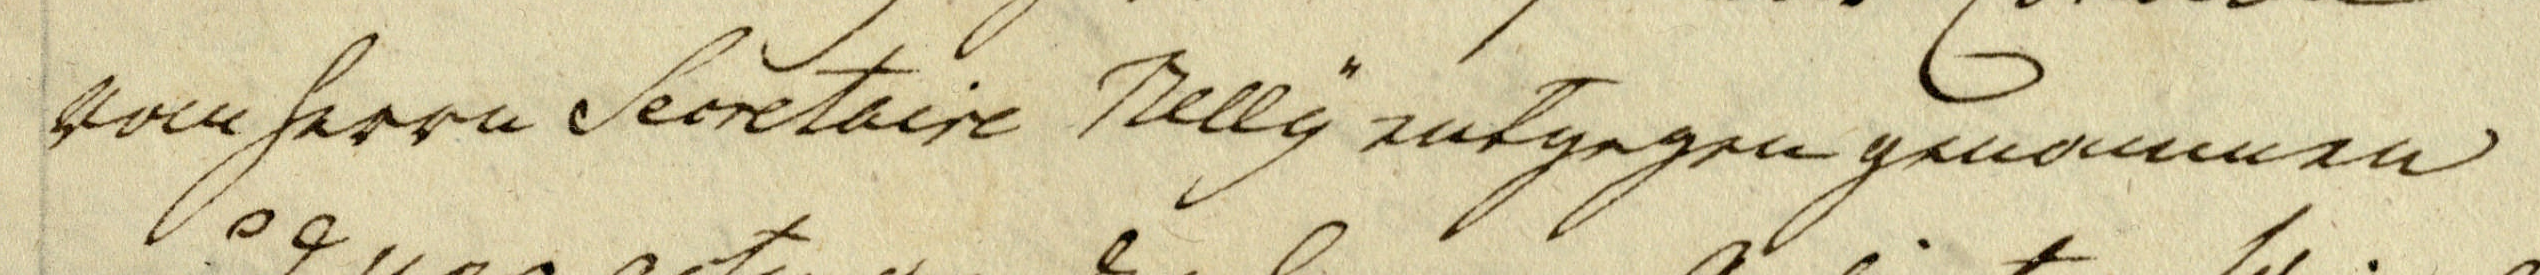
vom Herrn Secretaire Nellÿ entgegen genommen
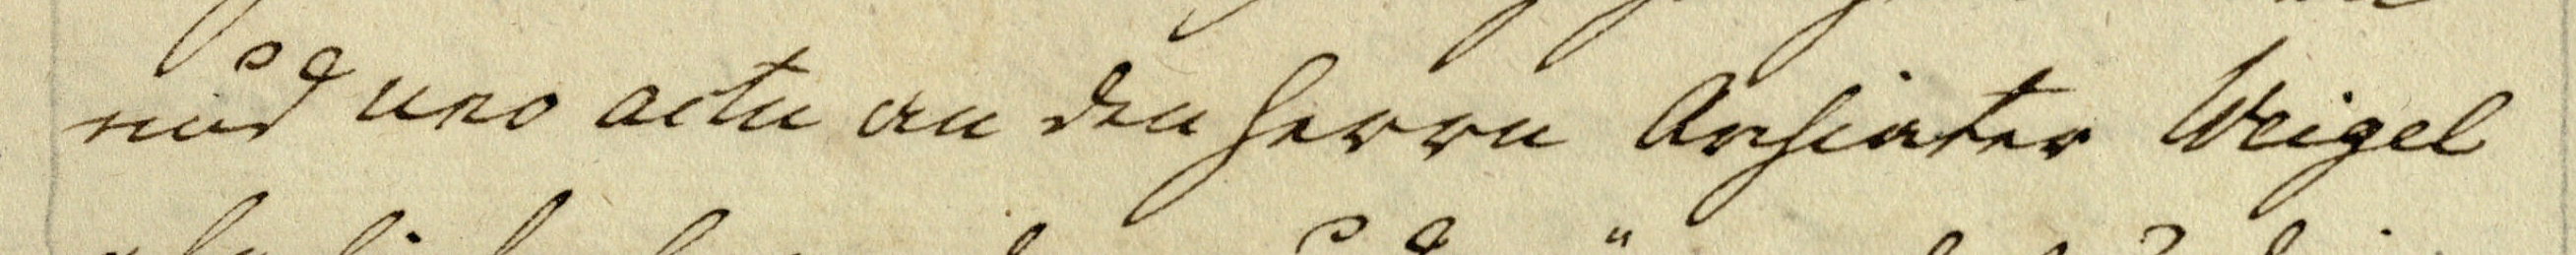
und uno actu an den Herrn Archiater Weigel
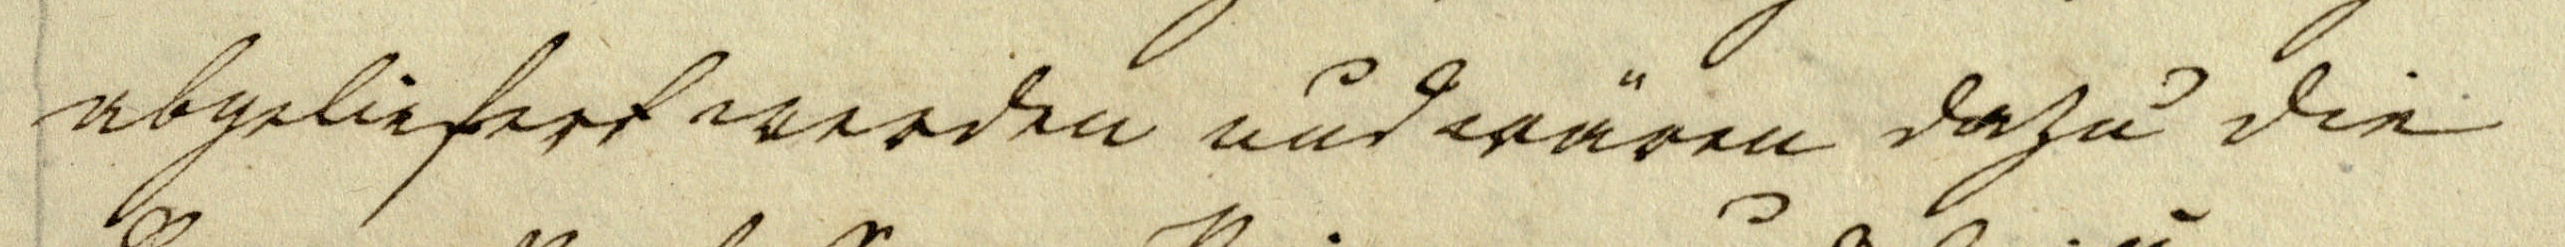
abgeliefert werden und wären dazu die
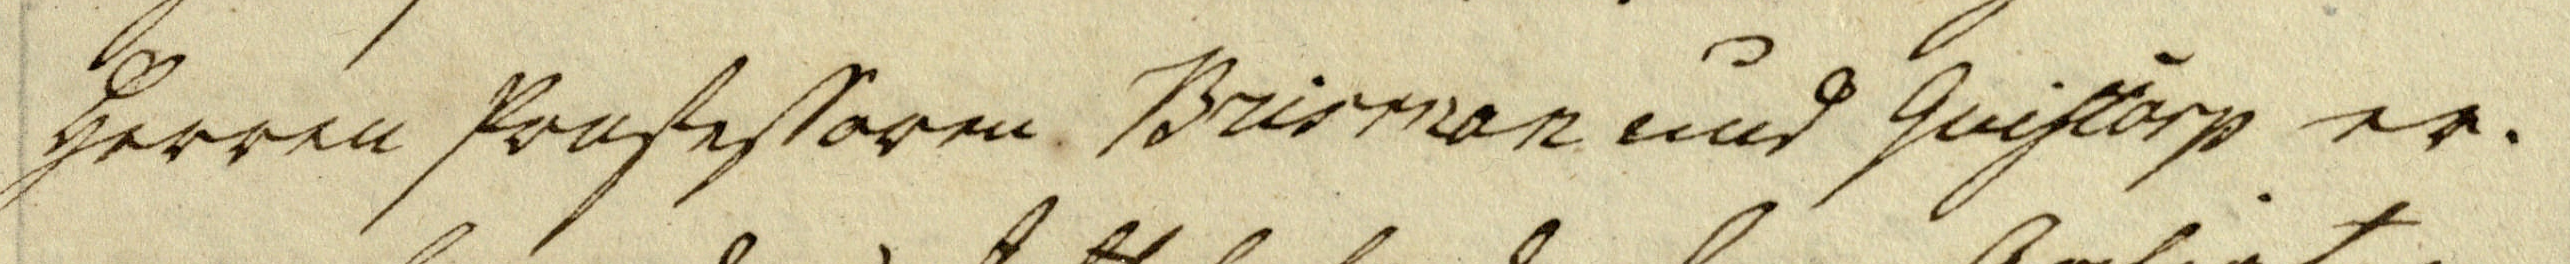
Herren Professoren Brisman und Quistorp er¬
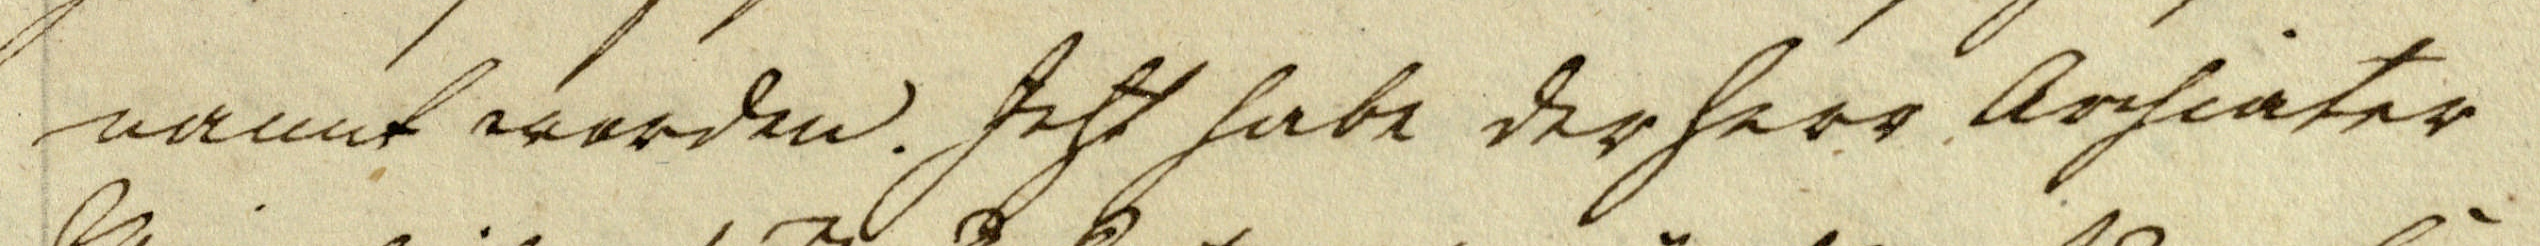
nannt worden. Jetzt habe der Herr Archiater
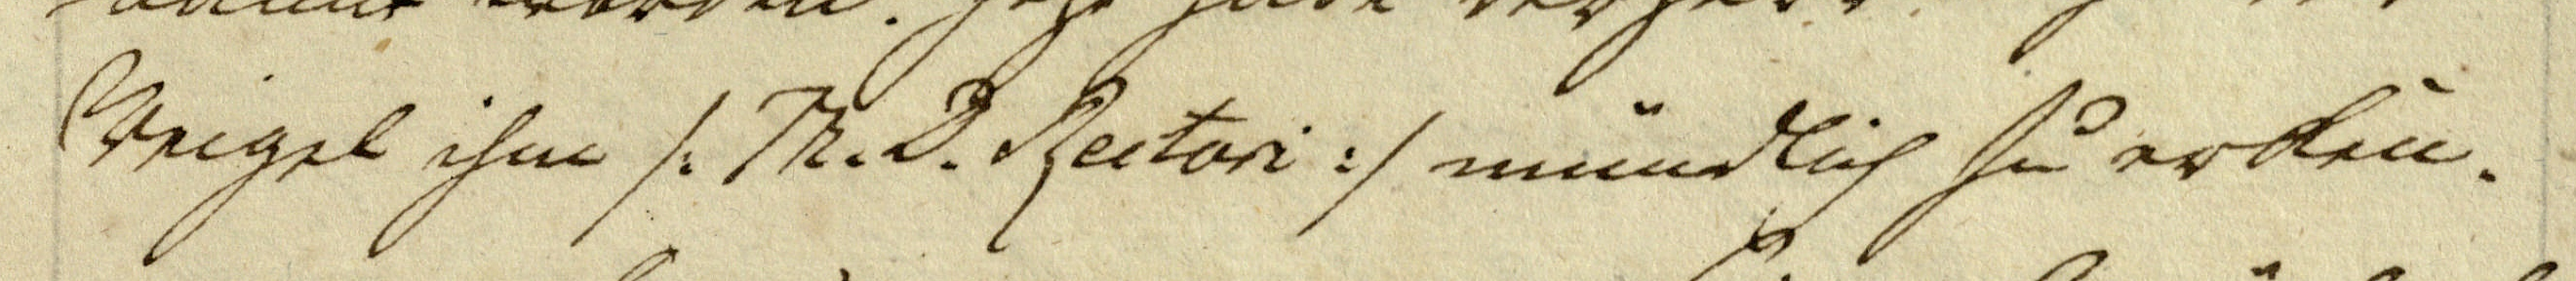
Weigel ihm /: M. D. Rector :/ mündlich zu erken¬
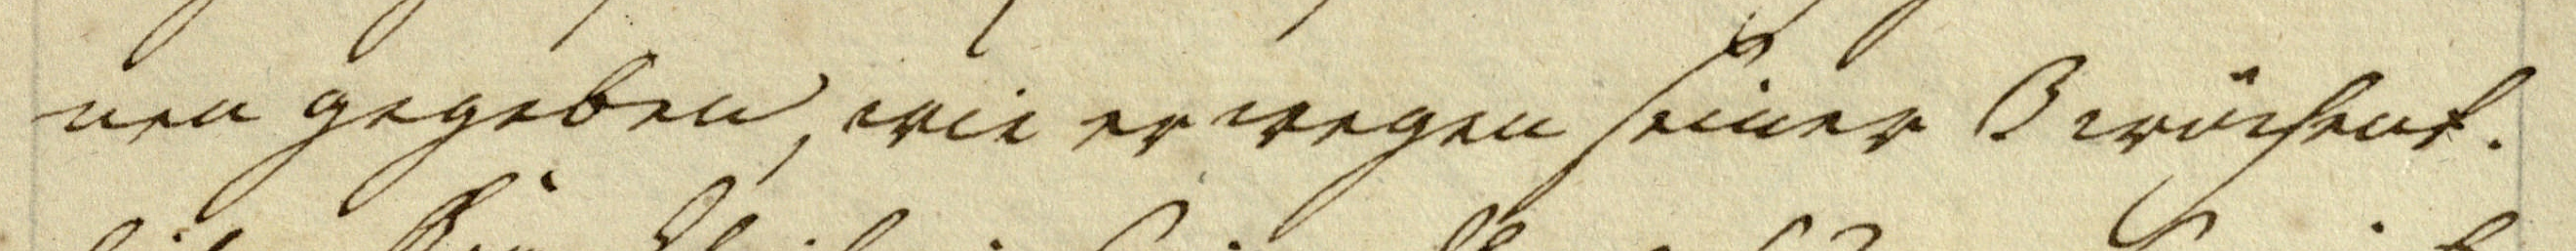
nen gegeben, wie er wegen seiner 3 wöchent¬
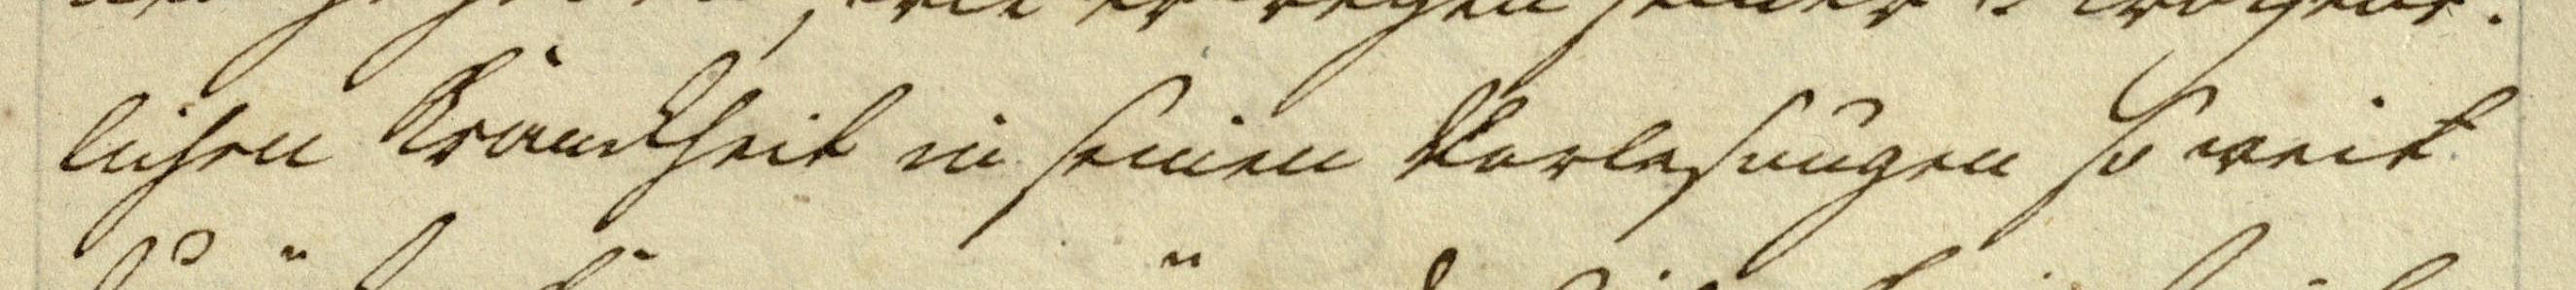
lichen Kranckheit in seinen Vorlesungen so weit
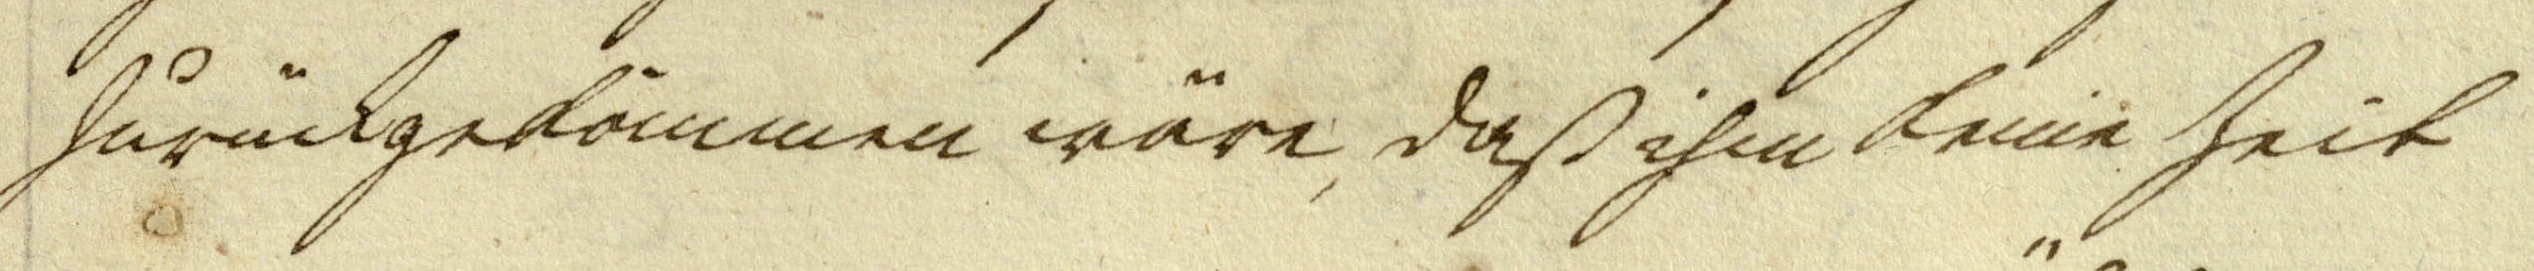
zurückgekommen wäre, daß ihm keine Zeit
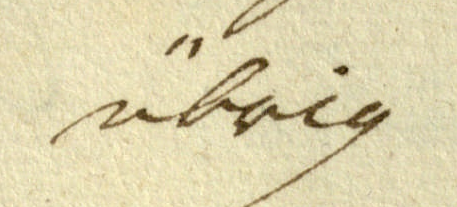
übrig
